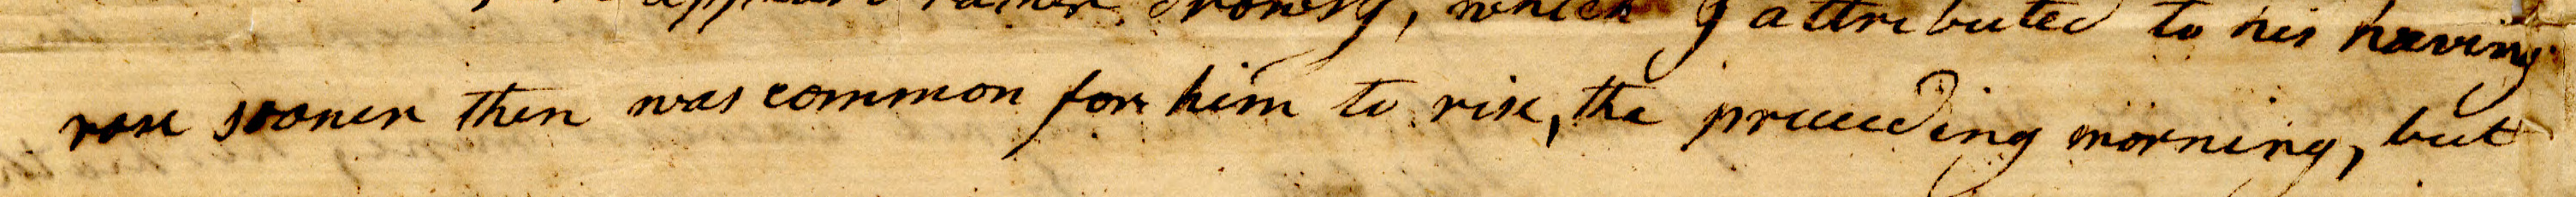rose sooner than was common for him to rise, the preceeding morning, but
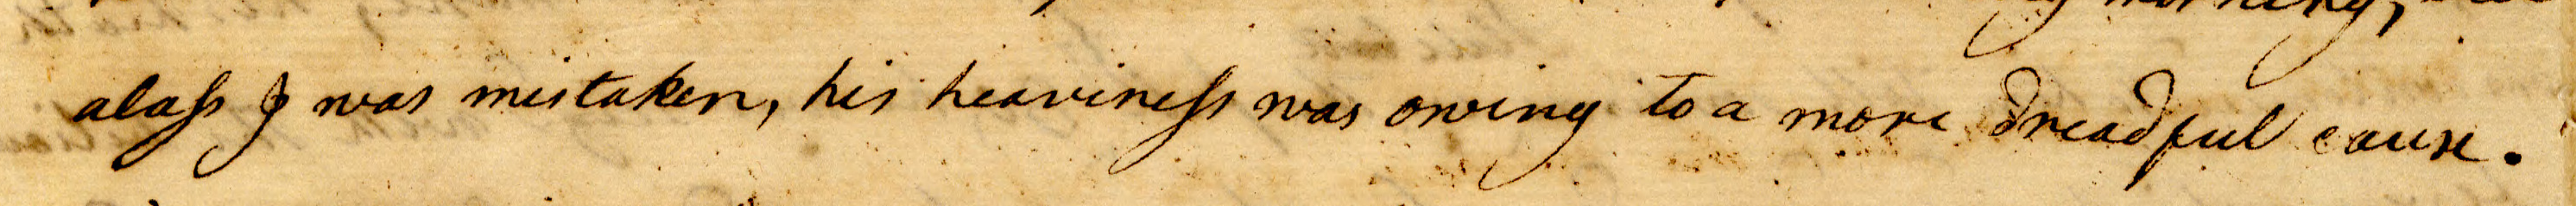alas I was mistaken, his heaviness was owing to a more dreadful cause.
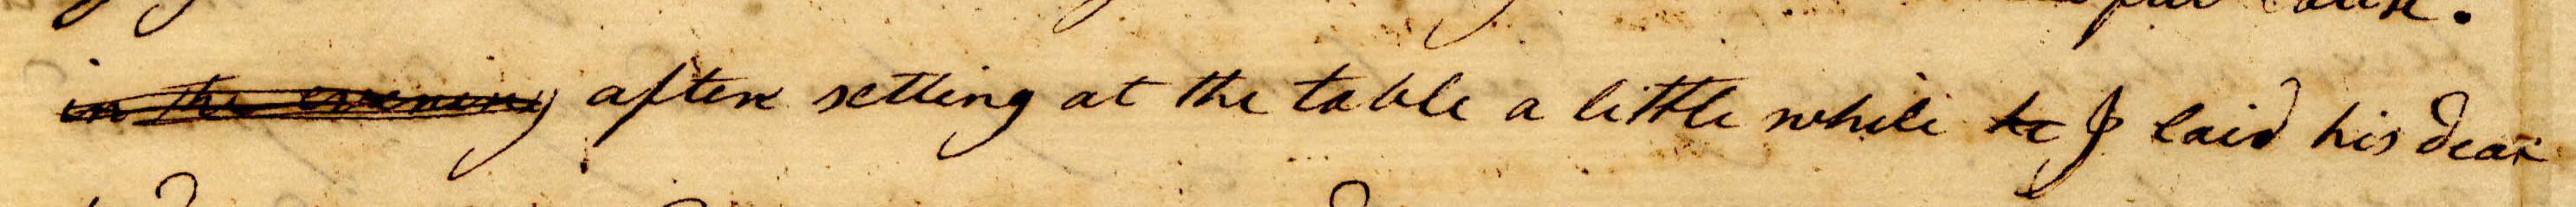[in the evening] after setting at the table a little while I laid his dear
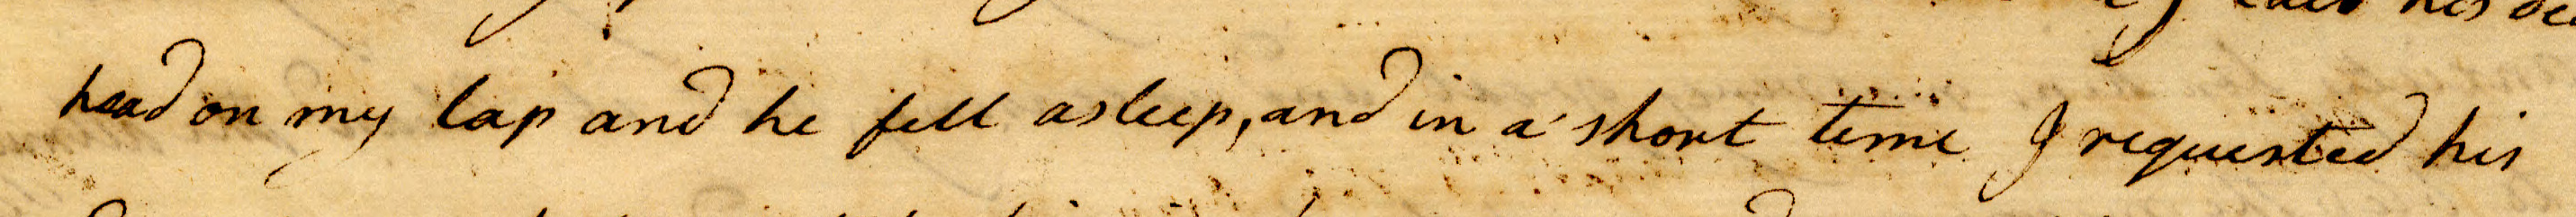head on my lap and he fell asleep, and in a short time I requested his
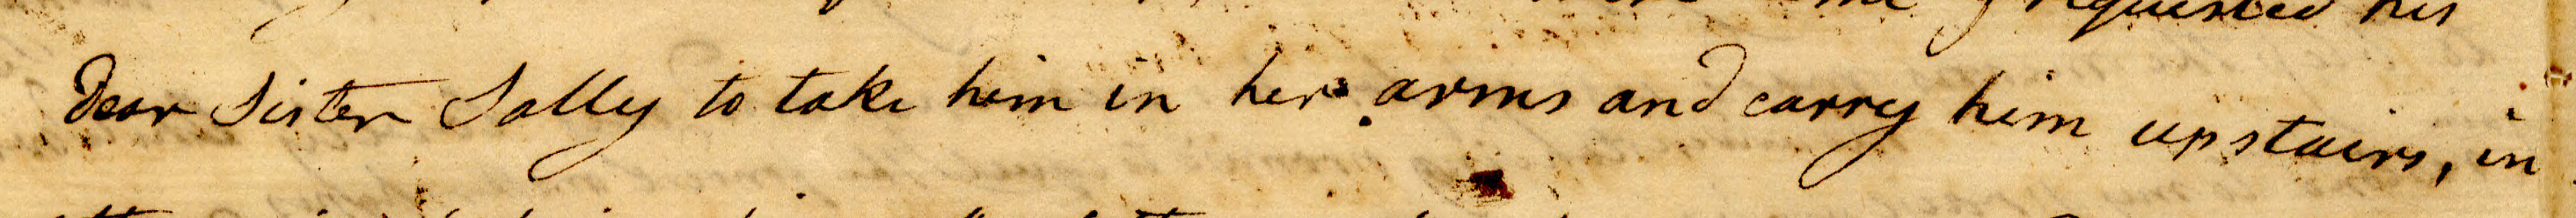dear sister Sally to take him in her arms and carry him upstairs, in
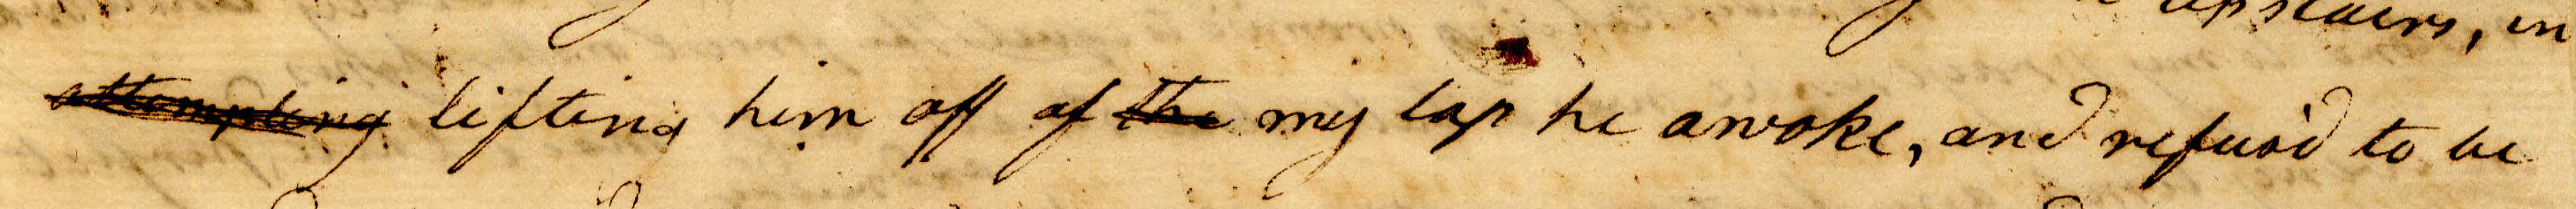[attempting] lifting him off of my lap he awoke, and refus'd to be
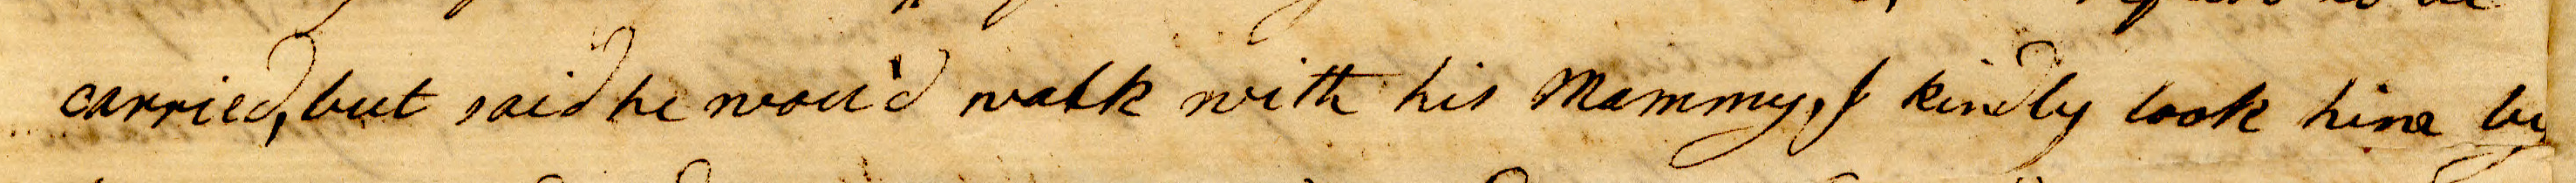carried, but said he wou'd walk with his Mammy, I kindly took him by
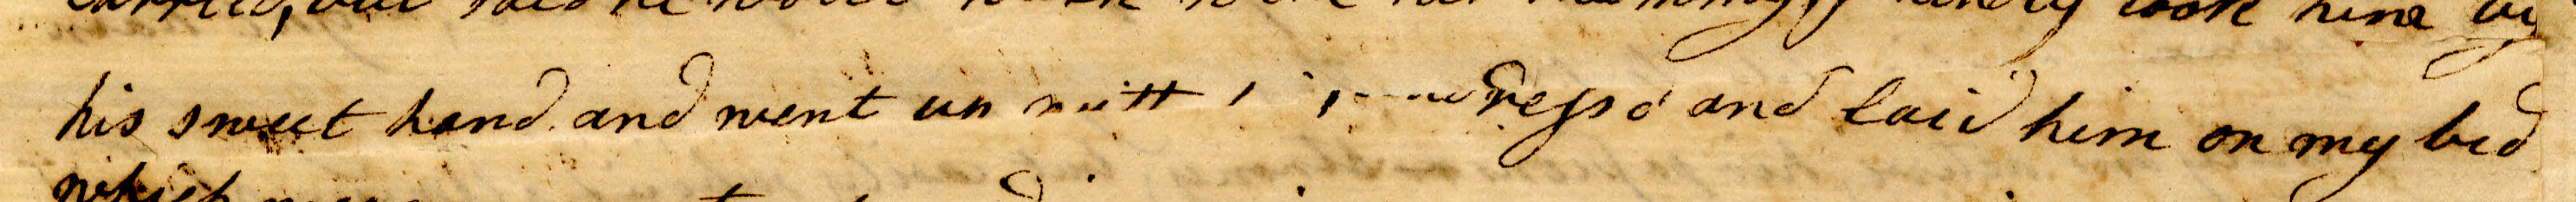his sweet hand and went up with [____]ness and laid him on my bed
